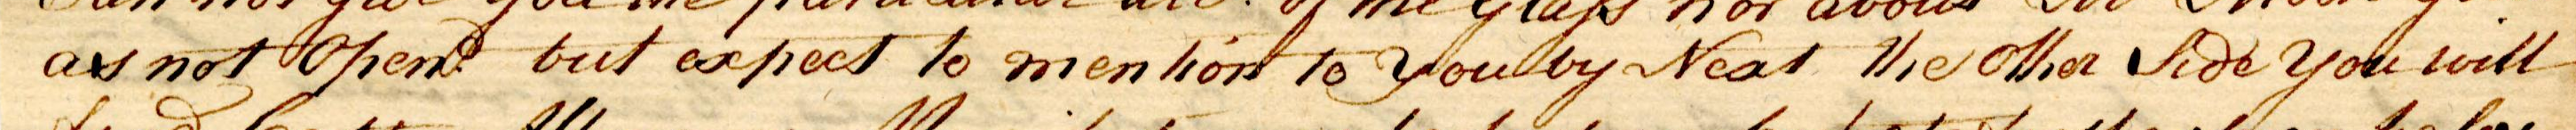as not Open^d but expect to mention to you by Next the other side you will
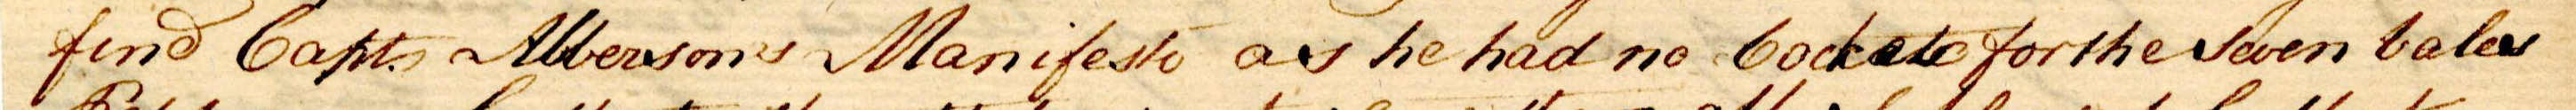find Capt. Allersons Manifest as he had no Cockale for the seven bales
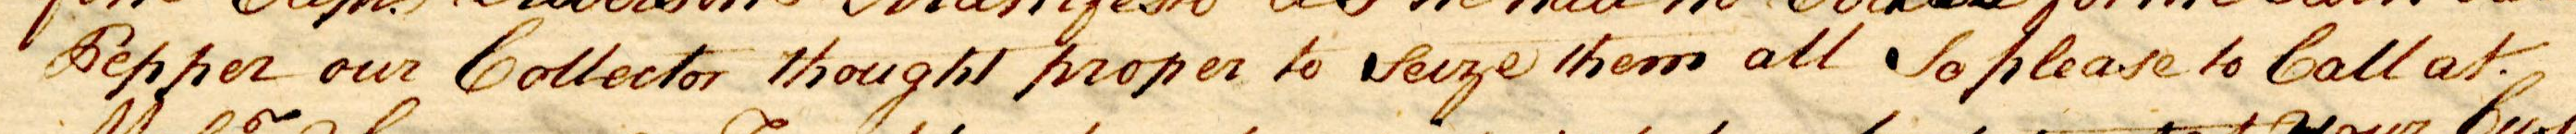Pepper our collecter thought proper to seize them all so please to Call at.
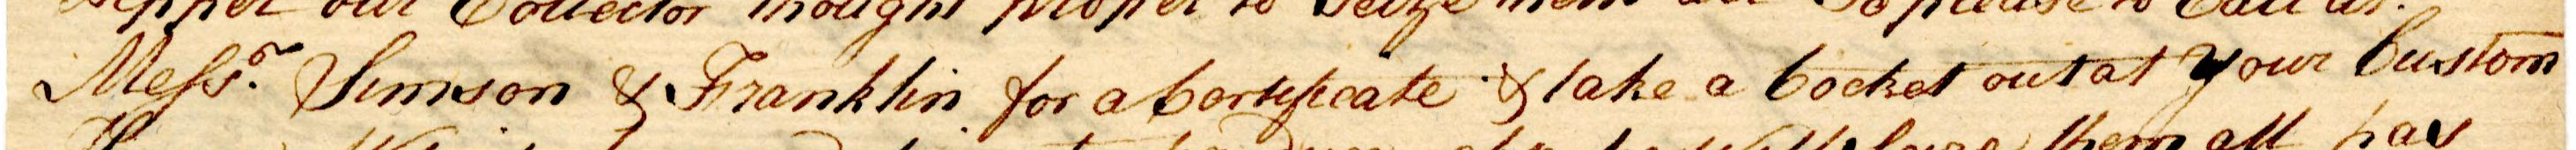Mess^rs. Simson & Franklin for a cortepeale & take a cocket out at your custom
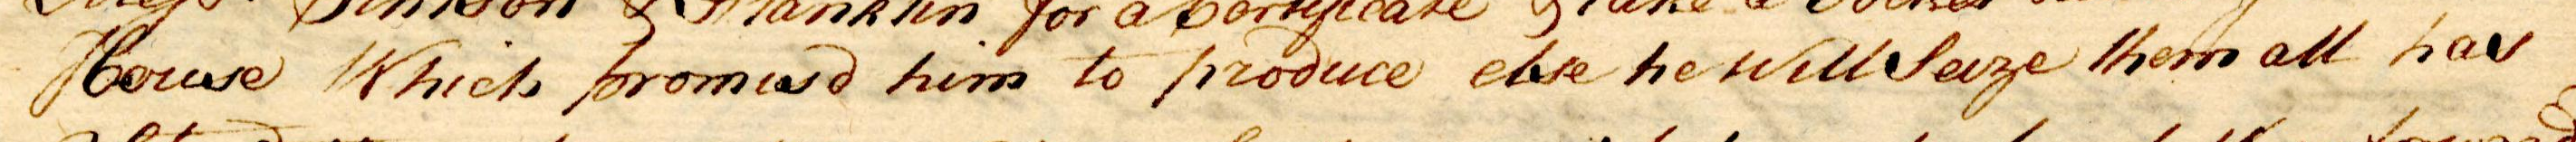House Which promesd him to produce else he will seize them all hav
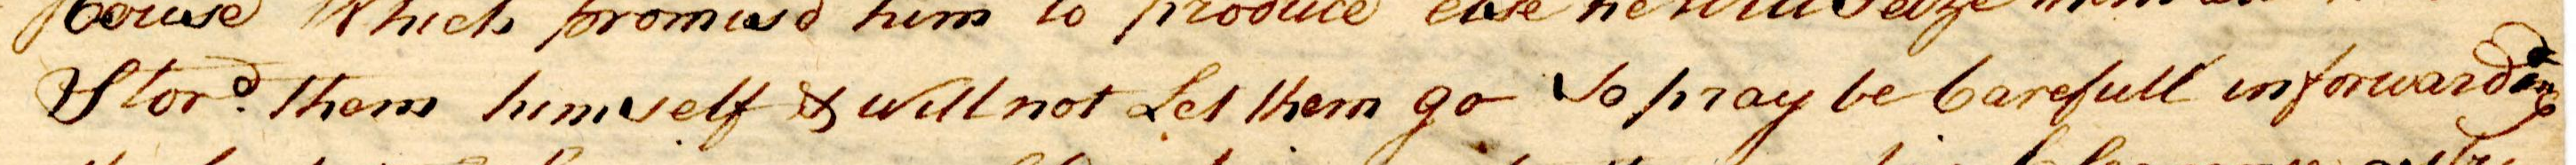Stor^d. them himself & will not Let them go so pray be carefull inforwarding
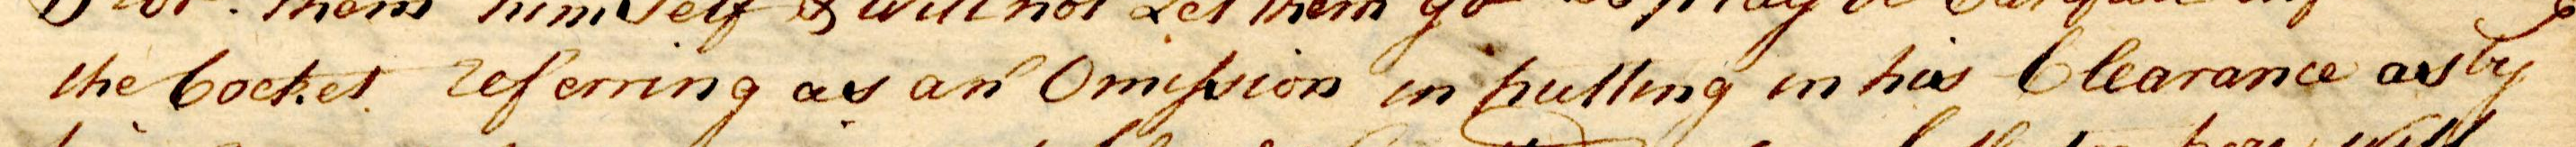the Cocket referring as an omission in putting in his Clearance as by
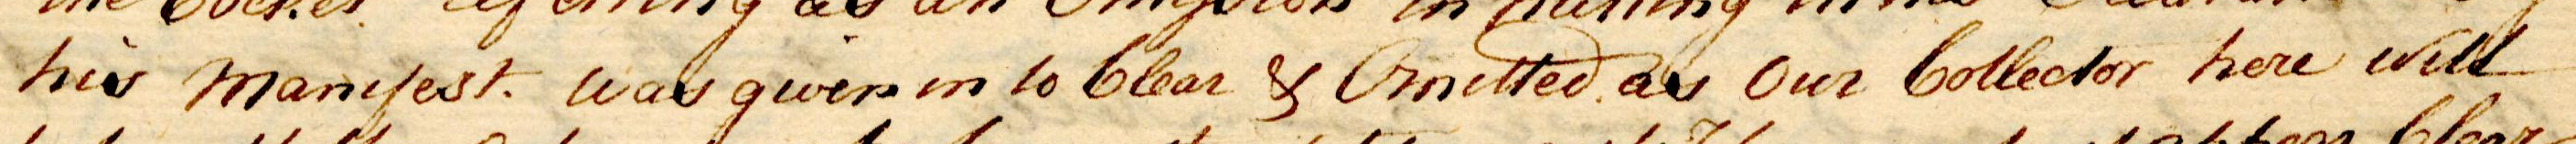his manifest. was given in to clear & Omitted as our collector here will
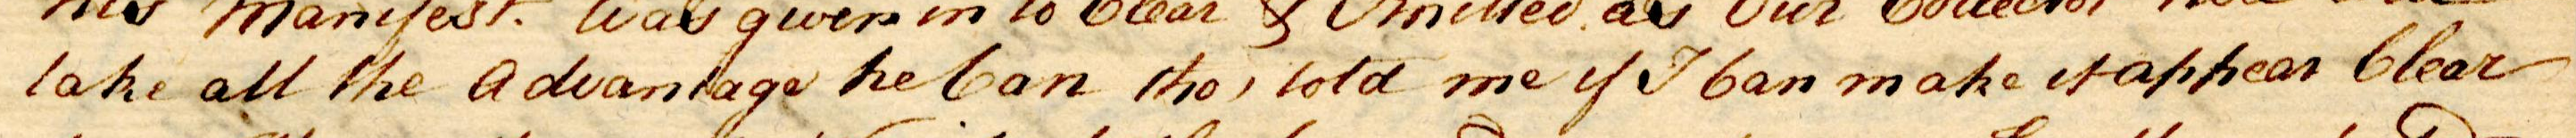take all the advantage he Can tho, told me if I Can make it appear Clear
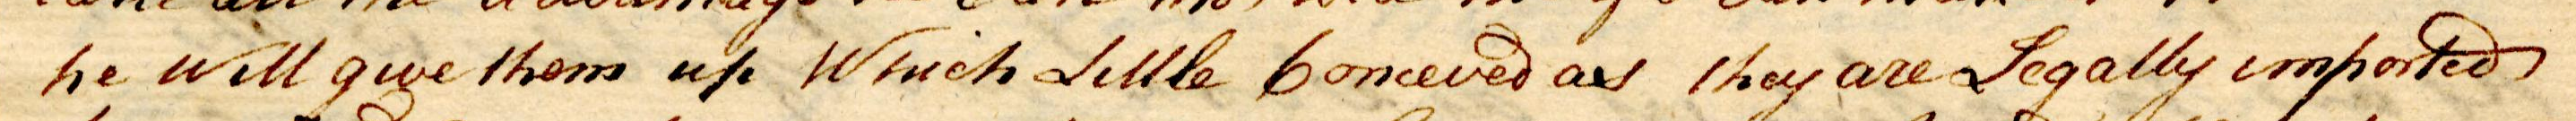he will give them up Which Little conceved as they are Legally imported
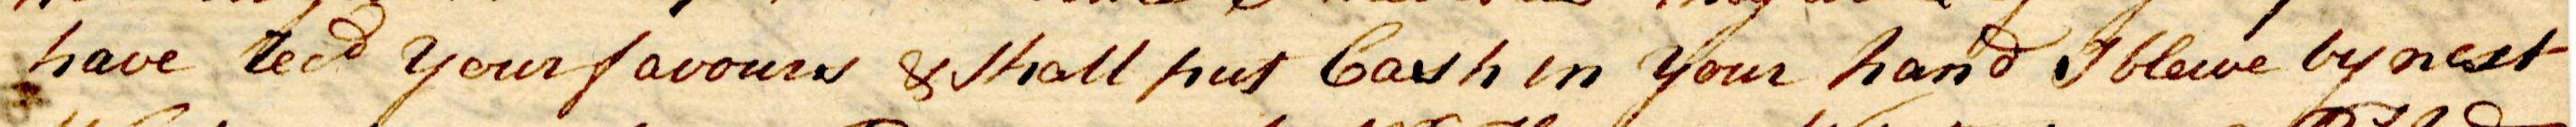have rec^d your favours & shall put Cash in your hand I believe by next
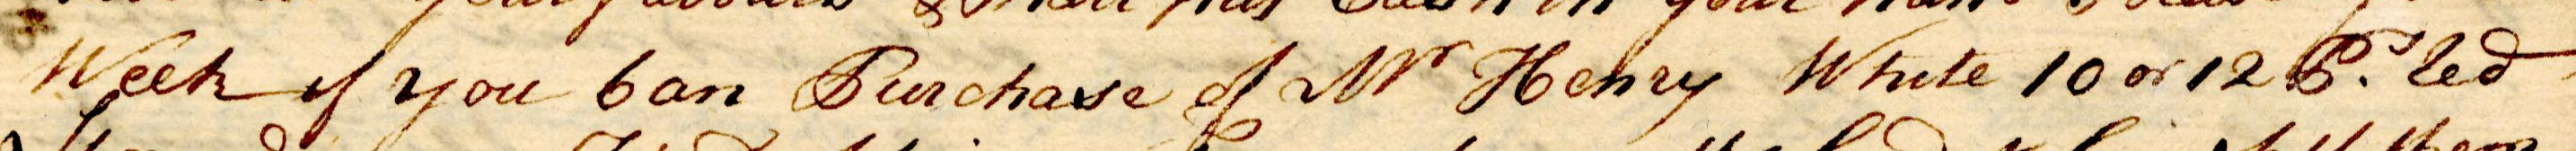Week if you can Purchase of M^r Henry White 10 or 12 P^s. led
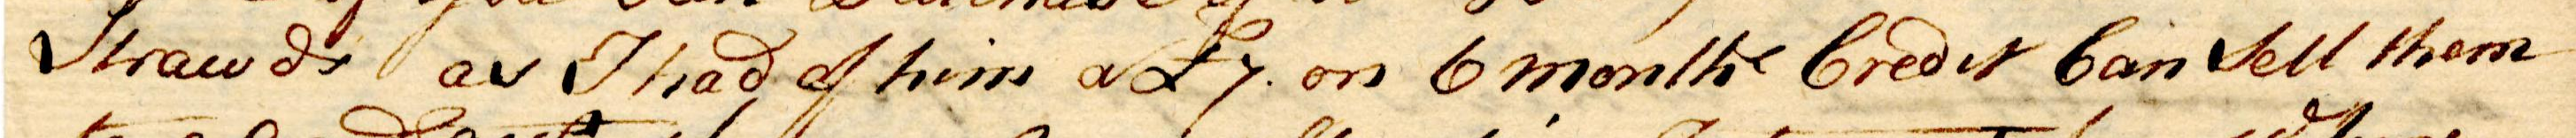Strawds as I had of him a £7 on 6 month Credit Can sell them
